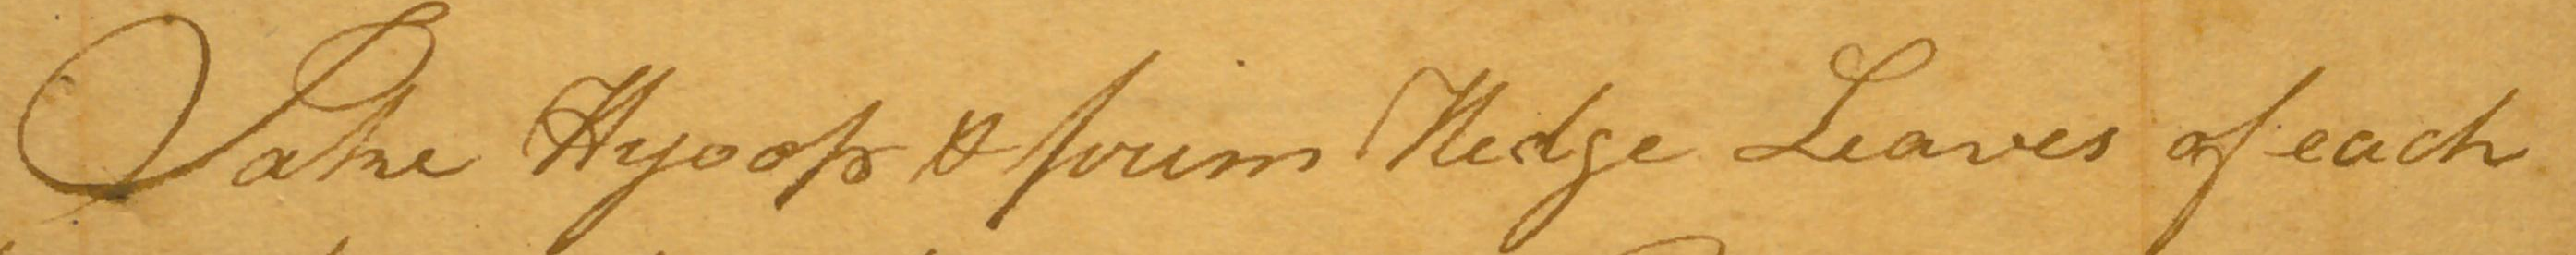Take Hysop & prim Hedge Leaves of each
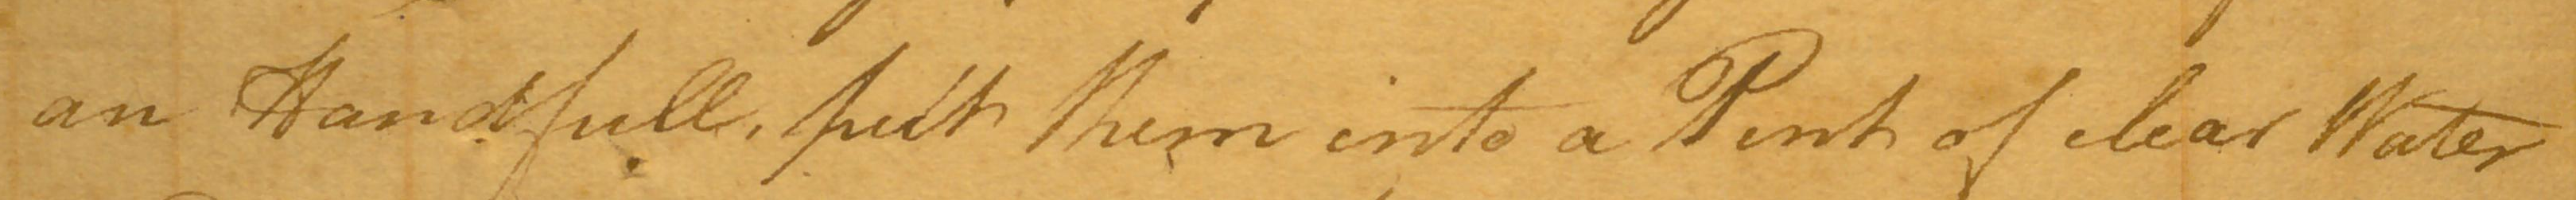an Handfull, put them into a Pint of clear Water
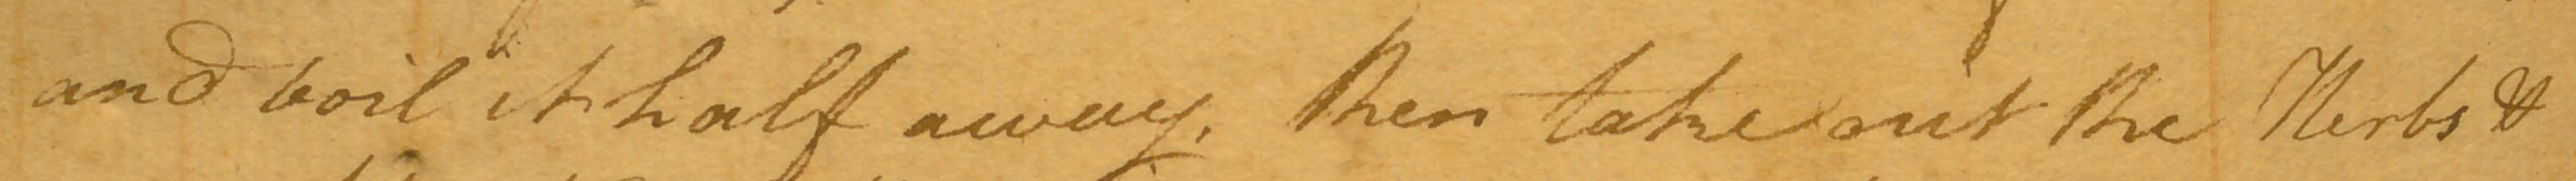and boil it half away, then take out the Herbs &
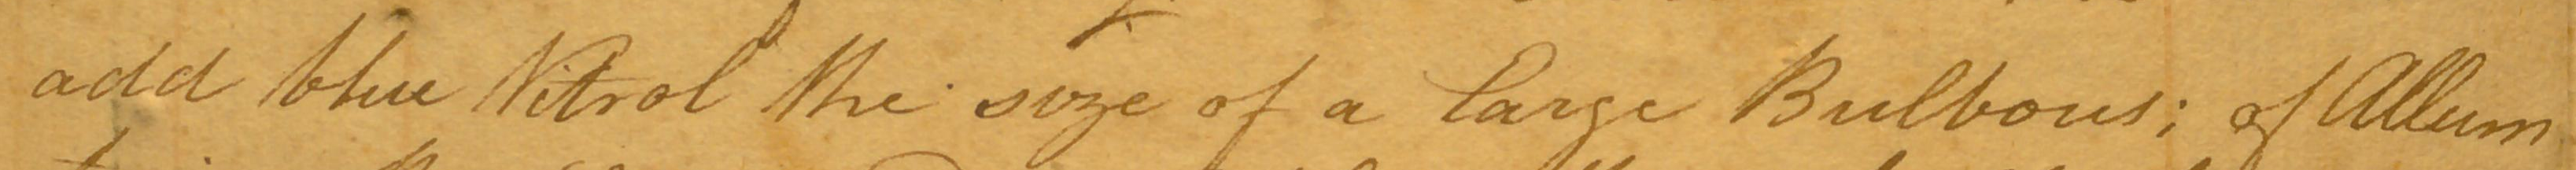add blue Vitrol the size of a large Bulbous; of Allum
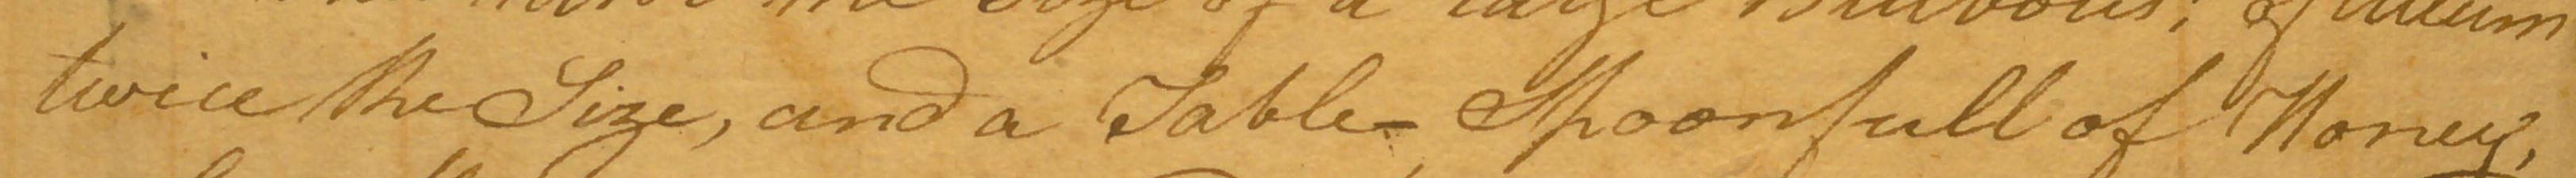twice the Size, and a Table-Spoonfull of honey,
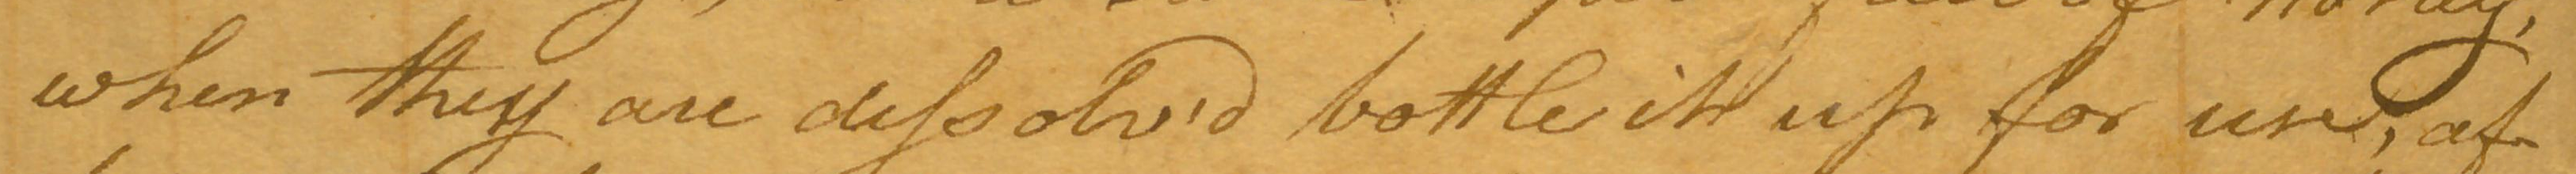when they are dissolv'd bottle it up for use, af
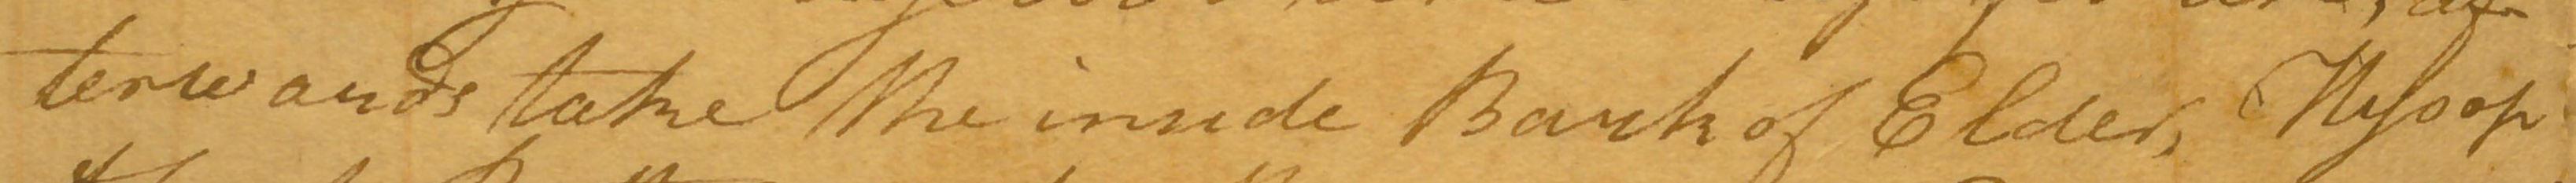terwards take the inside Bark of Elder, Hyssop
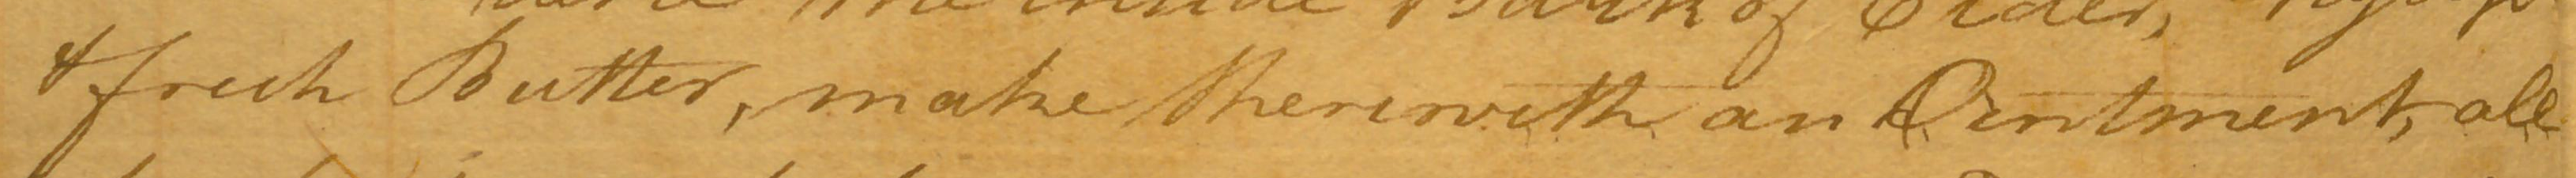& fresh Butter, make therewith an Ointment, all
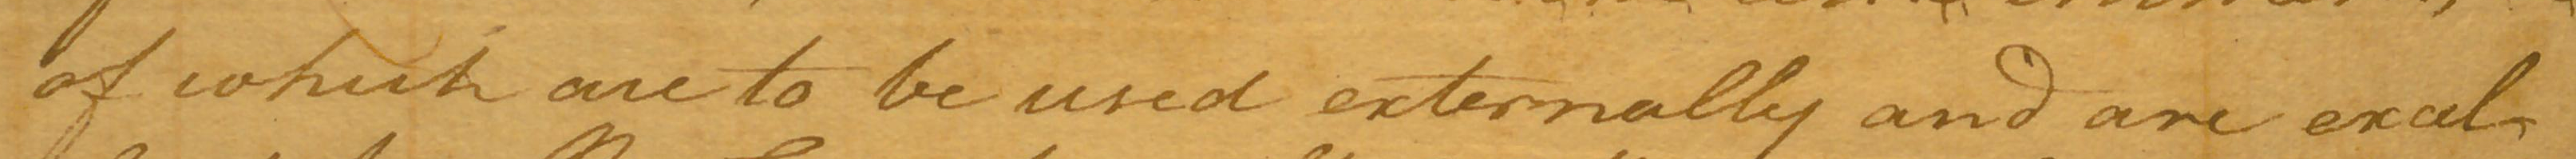of which are to be used externally and are excel
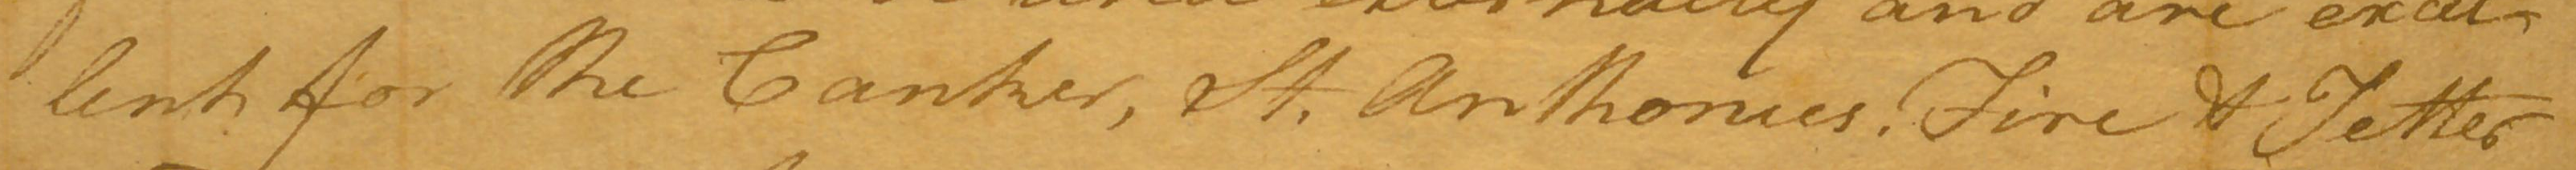lent for the Canker, St. Anthonies Fire & Jetter
